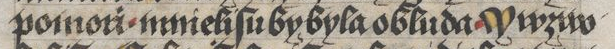poinoṙi.mnieliſu by byla obluda.Y wziw¬
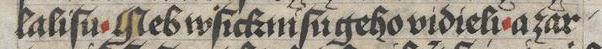laliſu.Neb wẛickni ſu geho vidieli.a zar¬
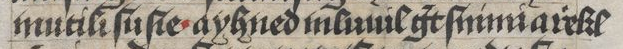mutili ſu ſie.a yhned mluuil ḡt ſnimi a ṙekl
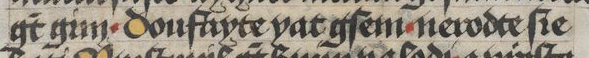ḡt gim.Doufayte yat gſem.nerodte ſie
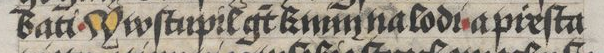bati.Y wſtupil ḡt knim na lodi.a pṙeſta¬
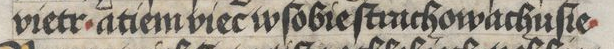víetr.a tiem víec.wſobie ſtrachowachu ſie.
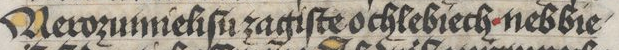Nerozumieli ſu zagiſte o chlebíech.neb bie¬
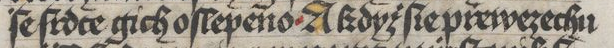ẛe ſrdce gich oſlepeno.A když ſie pṙewezechu
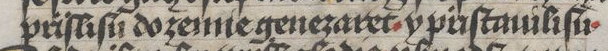pṙiẛli ſu do zemie genezaret.y pṙiſtauili ſu.
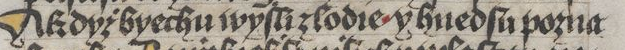A kdyż byechu vyẛli zlodie.y hnedſu.pozna¬
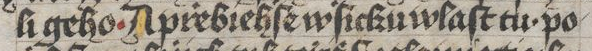li gwho.A pṙebiehẛe wẛicku wlaſt tu.po¬
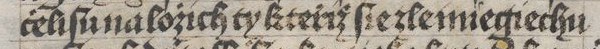ċeli ſu na lożích ty kteṙíż ſie zle miegíechu
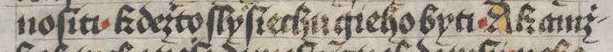noſiti.kdeżto ſlyẛiechu gieho byti.Akamž¬
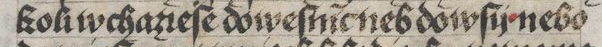koli wcházieẛe doweſnic neb dowſij.nebo
